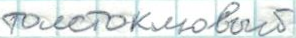толстоклювый
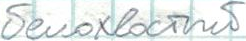белохвостый
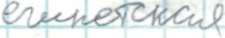египетская
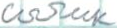сычик
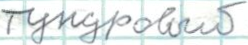тундровый
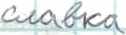славка
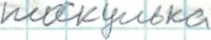пискулька
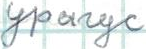урагус
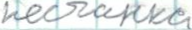песчанка
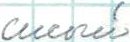сисый
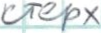стерх
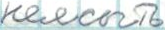неясыть
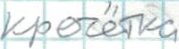кречётка
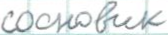сосновик
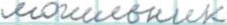могильник
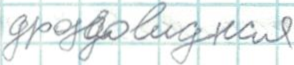дроздовидная
